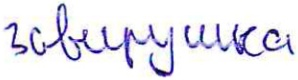завирушка
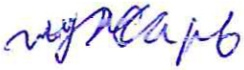глухарь
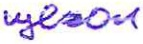щегол
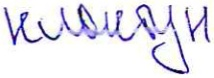клоктун
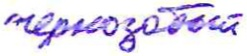чернозобый
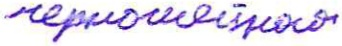черношейная
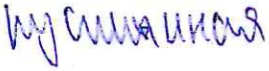пустынная
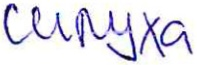сипуха
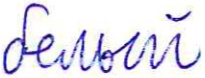белый
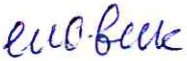еловик
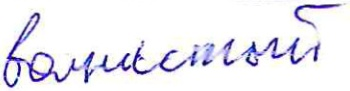волнистый
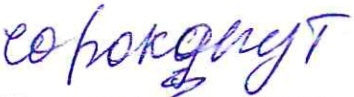сорокопут
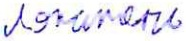лопатень
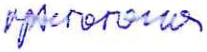красноногия
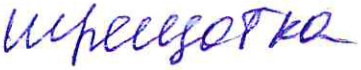трещотка
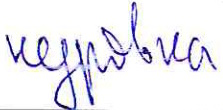кедровка
